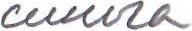синьга
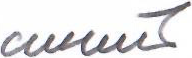синий
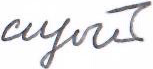сизый
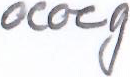осоед
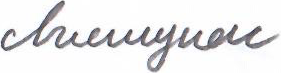свистунок
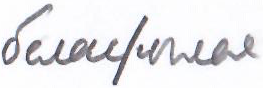белокрылая
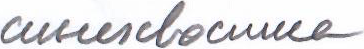синехвостка
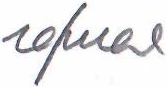горная
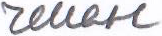чекан
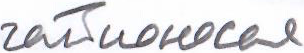чайконосая
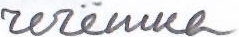чечётка
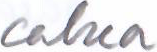савка
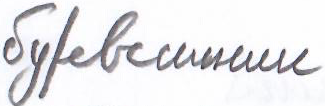буревестник
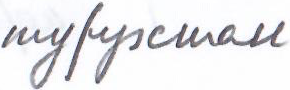турухтан
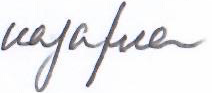казарка
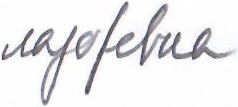лазоревка
